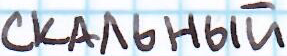скальный
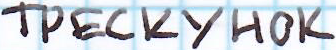трескунок
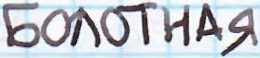болотная
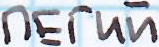пегий
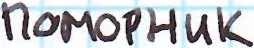поморник
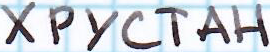хрустан
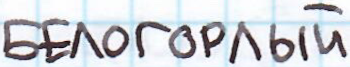белогорлый
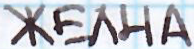желна
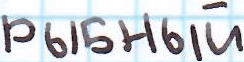рыбный
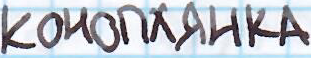коноплянка
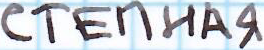степная
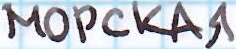морская
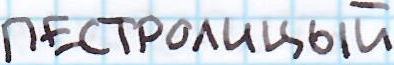пестролицый
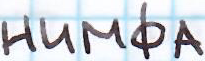нимфа
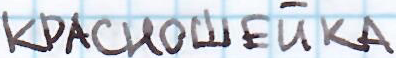красношейка
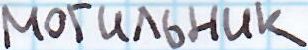могильник
